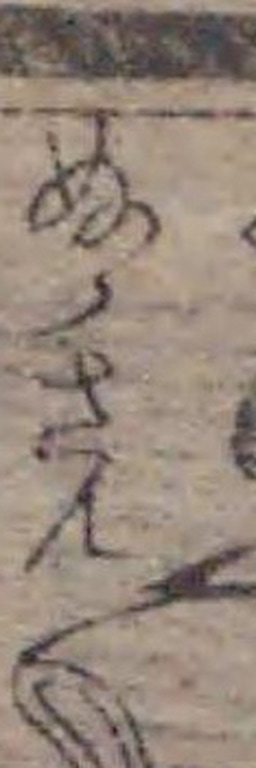ぬらさん
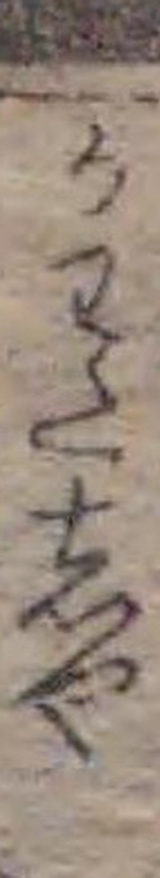かわたしや
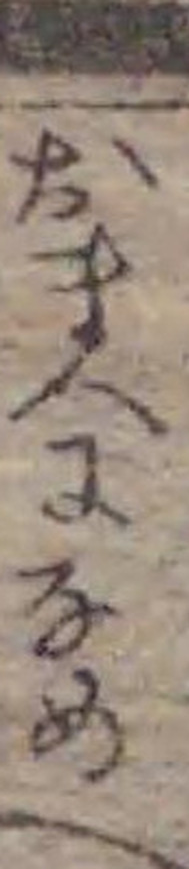おまへになめ
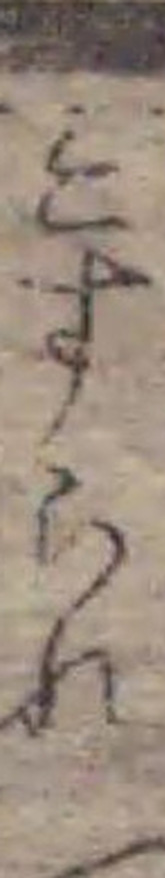こすられ
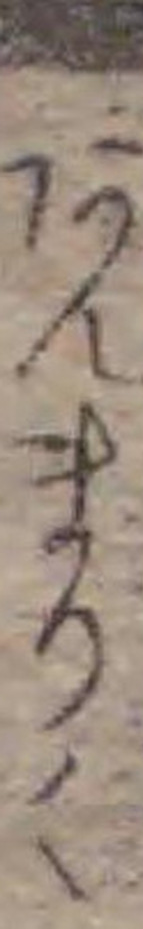あんまりく
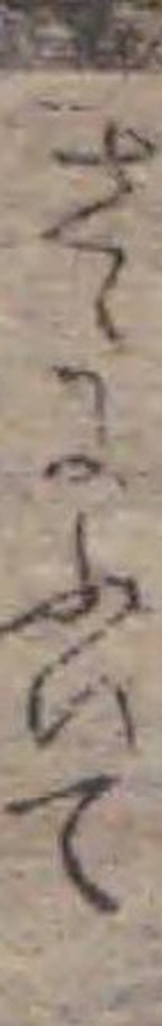さゝにふいて
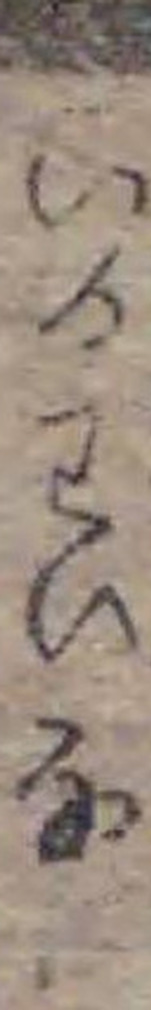いるわいな
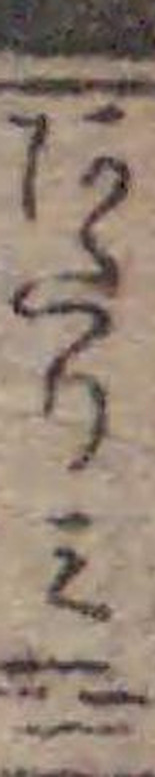あたりみ
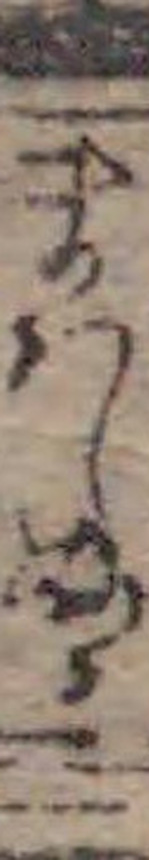まはしぬら
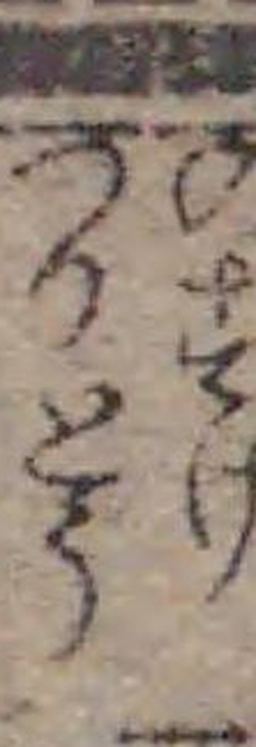つりとう
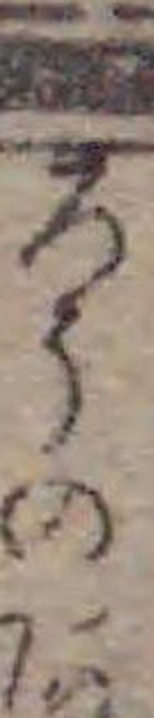ろうのあ
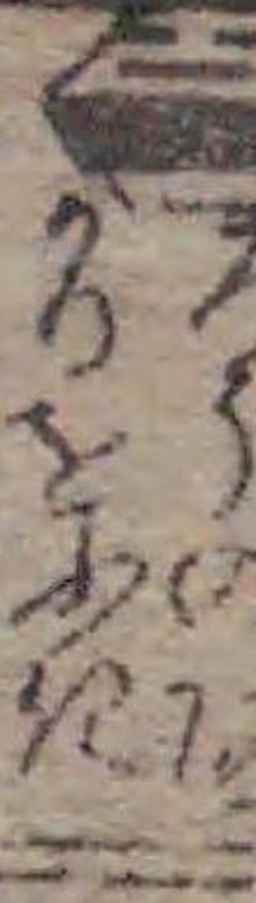かりをふき
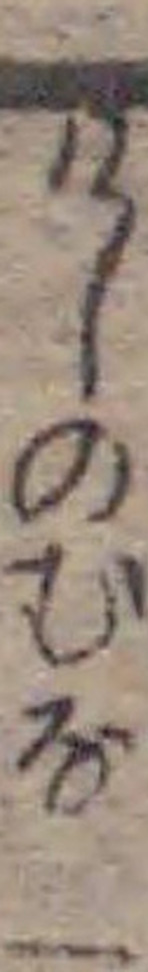けしのむな
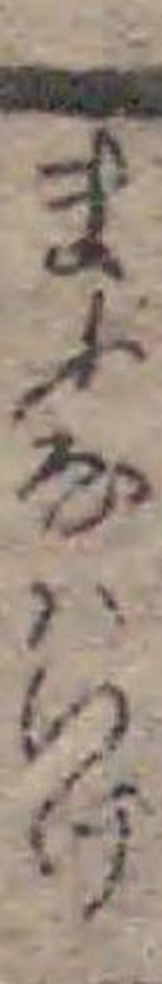まふなはいけ
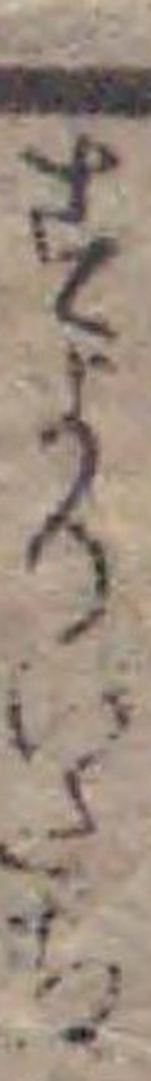すよりいたち
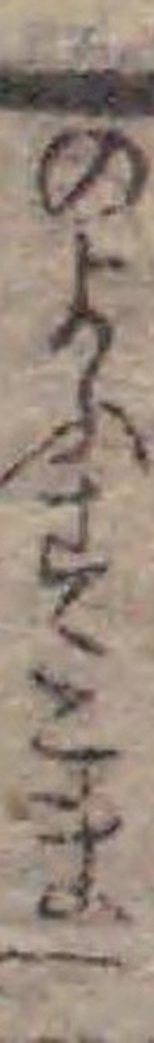のよふすこま
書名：化物七段目 : 2巻
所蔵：国立国会図書館 National Diet Library, JAPAN
